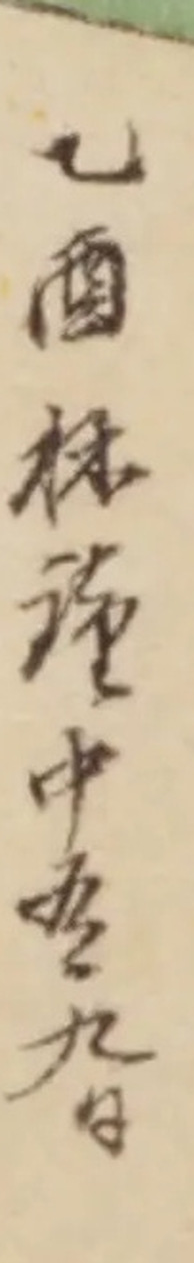乙酉林鐘中有九日
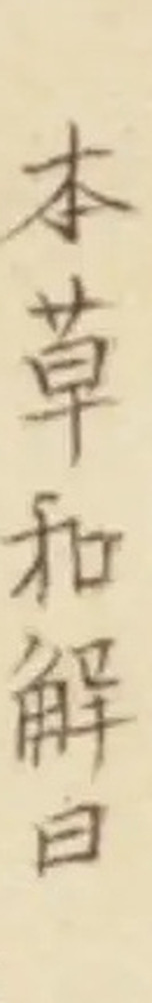本草和解曰
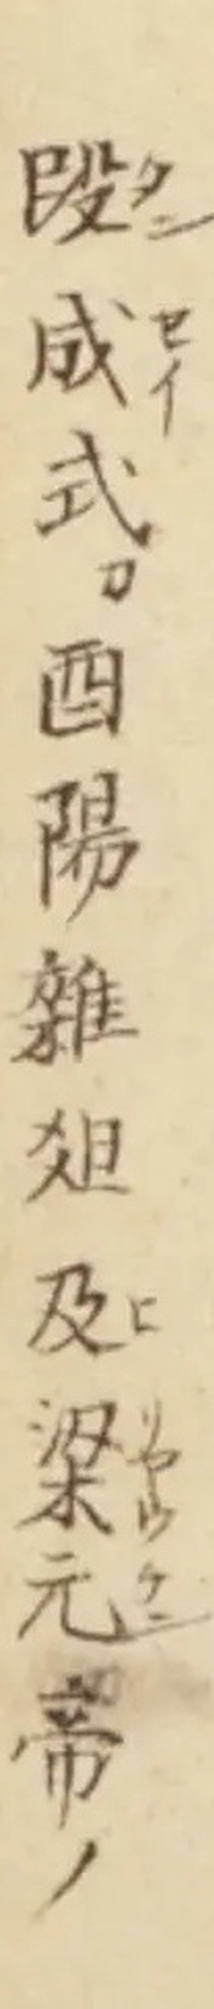段成式か酉陽雜爼及梁元帝の
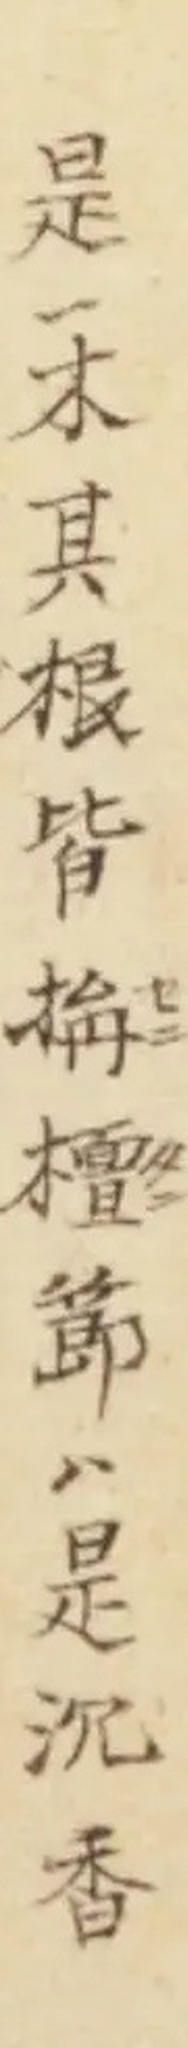是一木其根皆栴檀節は是沈香
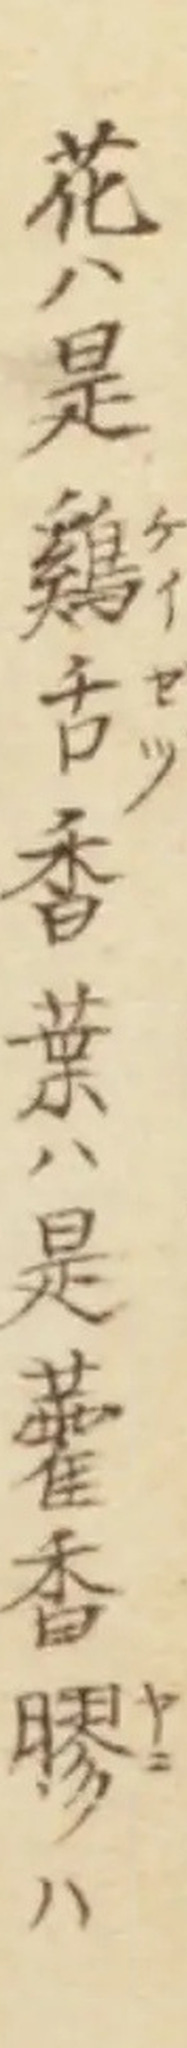花は是鶏舌香葉は是藿香膠は
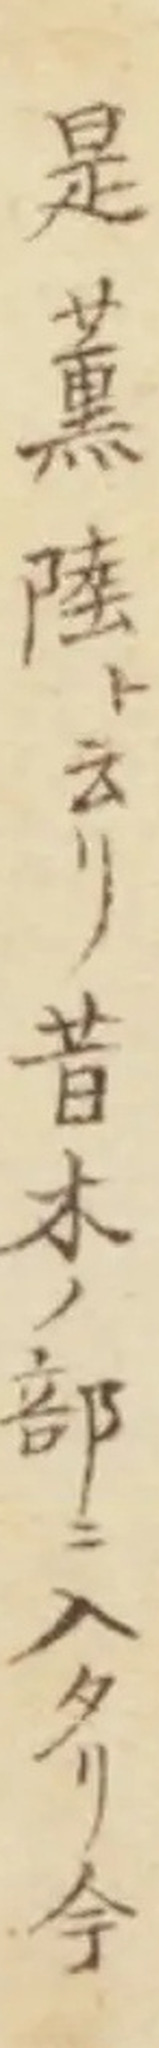是薫陸と云り昔木の部に入たり今
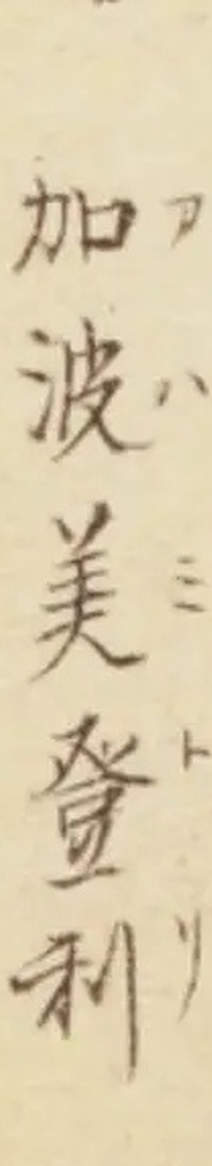和名加波美登利
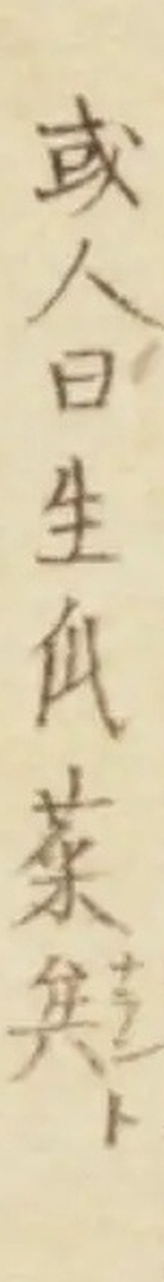或人曰生瓜菜矣と

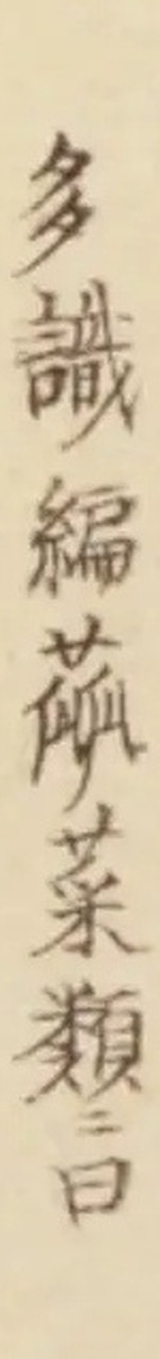多識編蓏菜類ニ曰
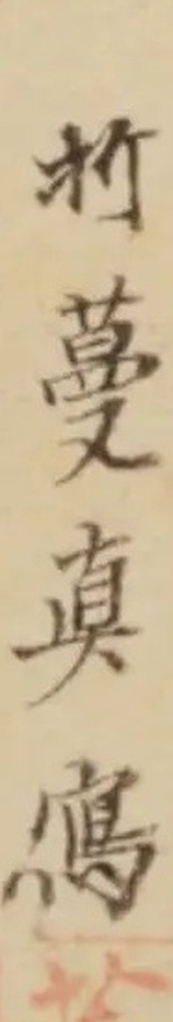折蔓真寫

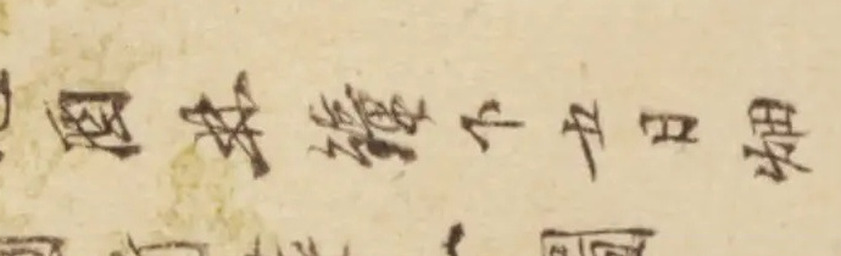乙酉林鐘下五日畑
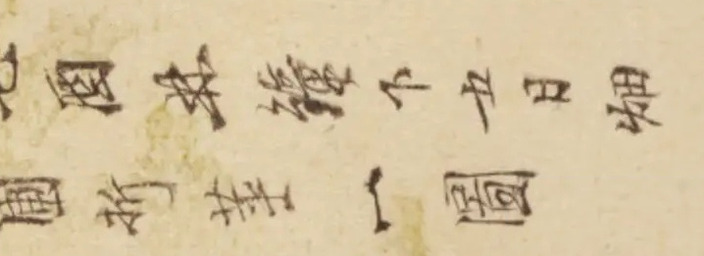乙酉林鐘下五日畑
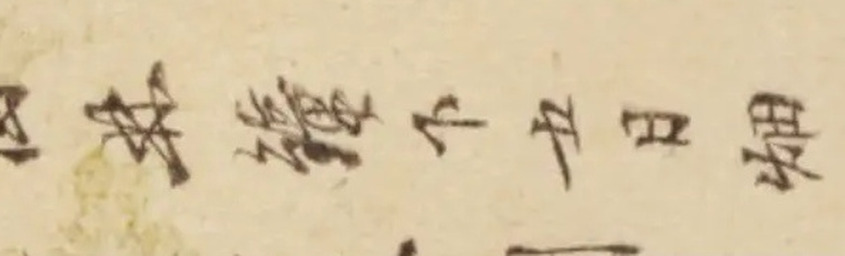乙酉林鐘下五日畑
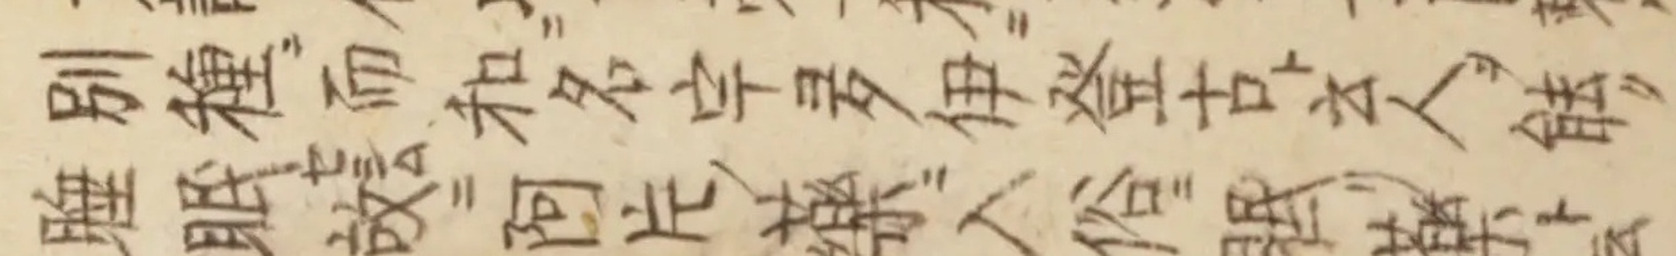別種に而和名宇多伊登古と云人を能く
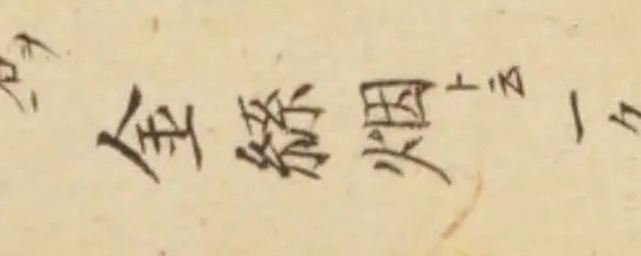金絲烟と云
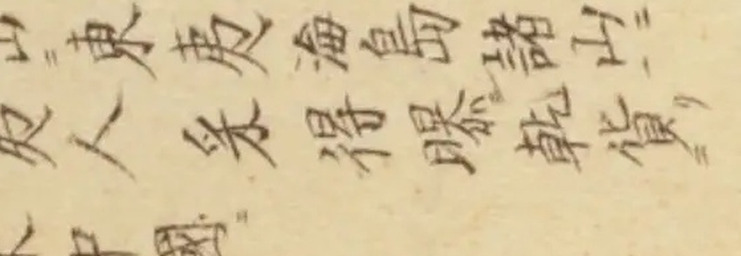夷人采得曝し乾貨く
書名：梅園草木花譜夏之部. 3
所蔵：国立国会図書館 National Diet Library, JAPAN
